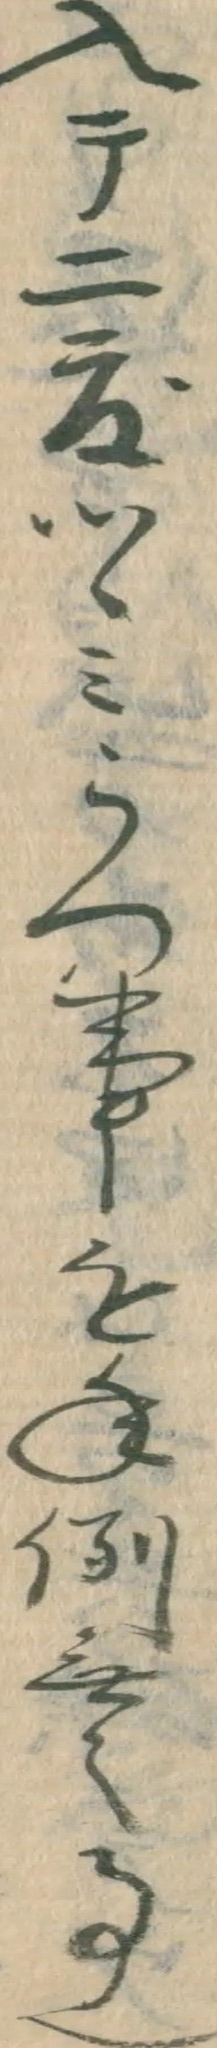入テ二度ツヽミうつ事近年例無之事也
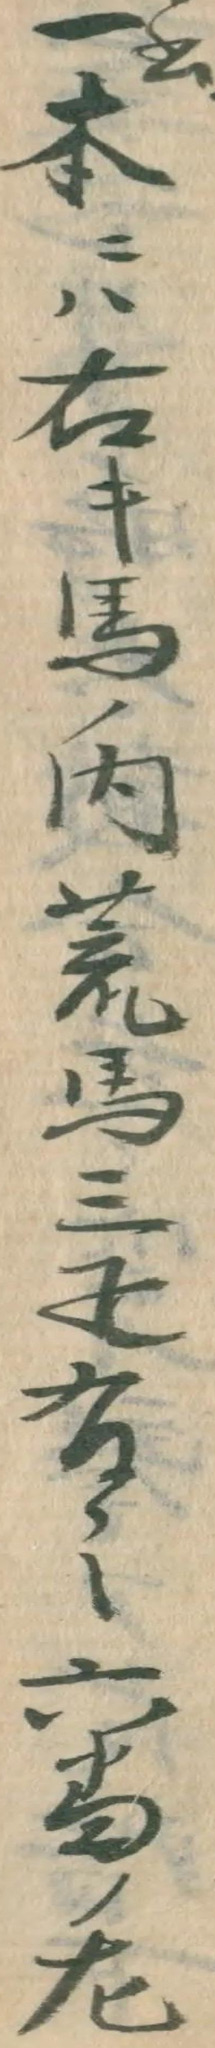一本ニハ右キ馬ノ内荒馬三疋有之六番ノ左

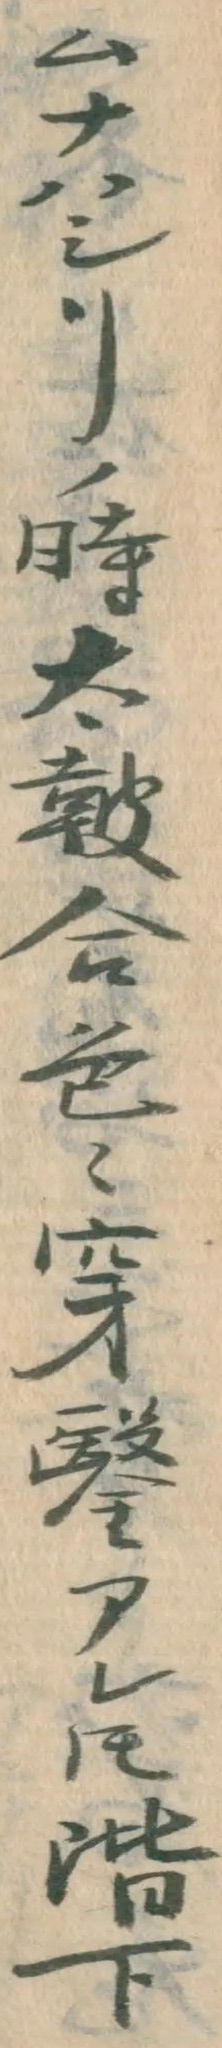ムナハシリノ時太鼓合色々穿鑿アレトモ階下
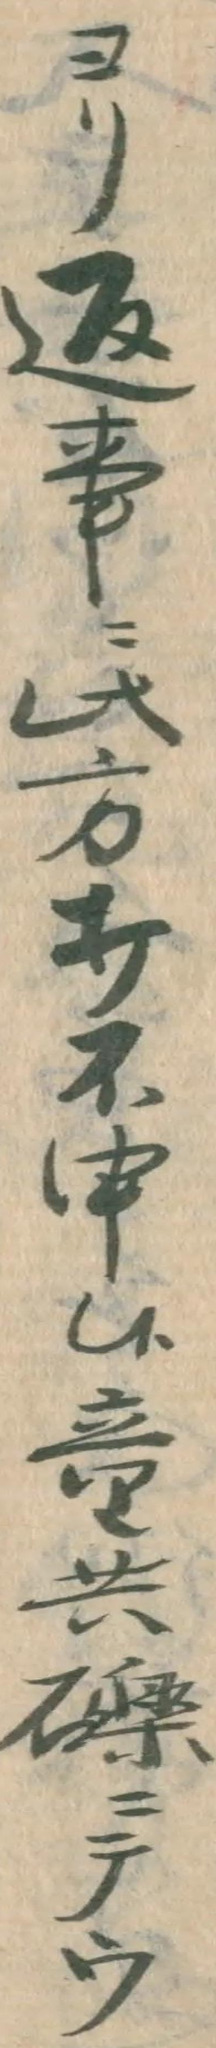ヨリ返事ニ此方打不申候童共礫ニテウ
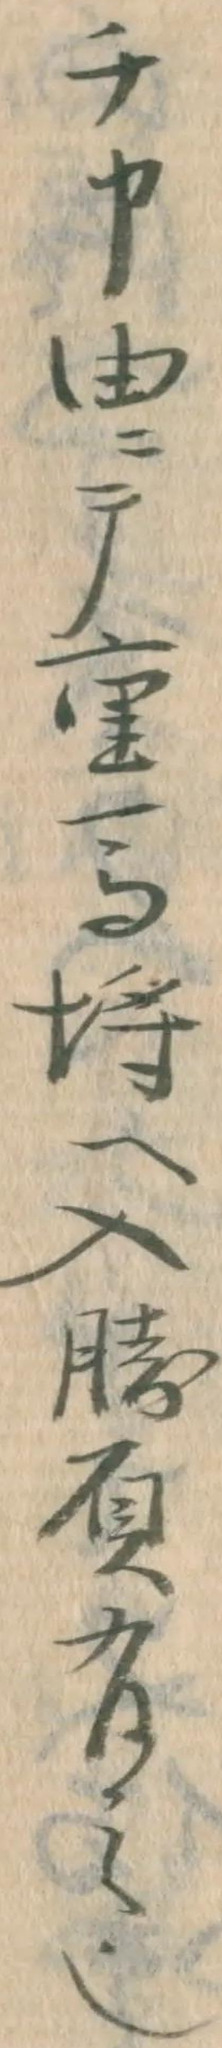チ申由ニテ重馬埒へ入勝負有之也
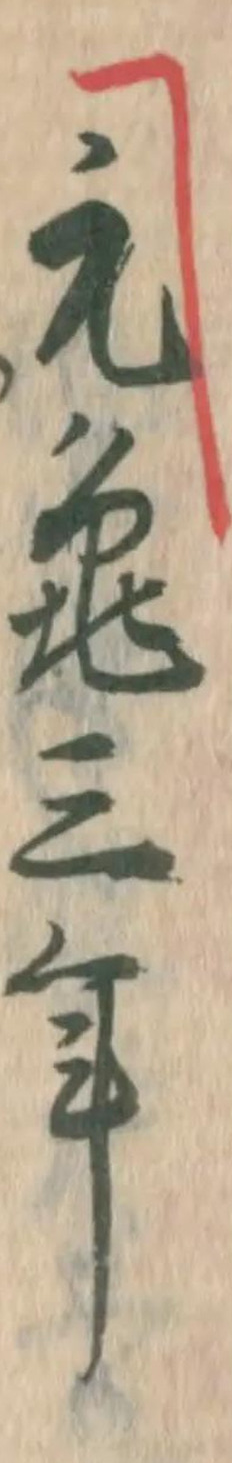元亀三年
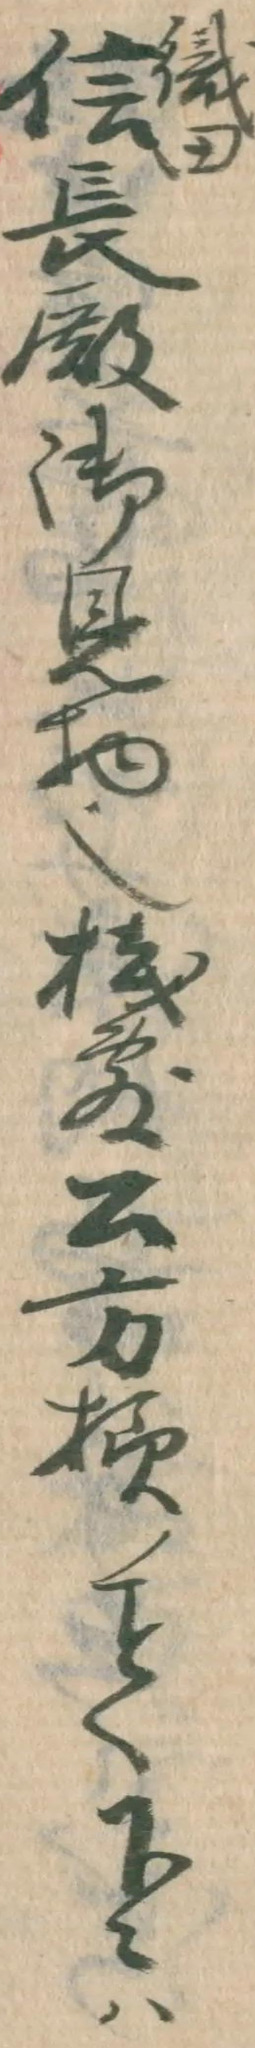信長殿御見物也桟敷公方様のことく下々ハ
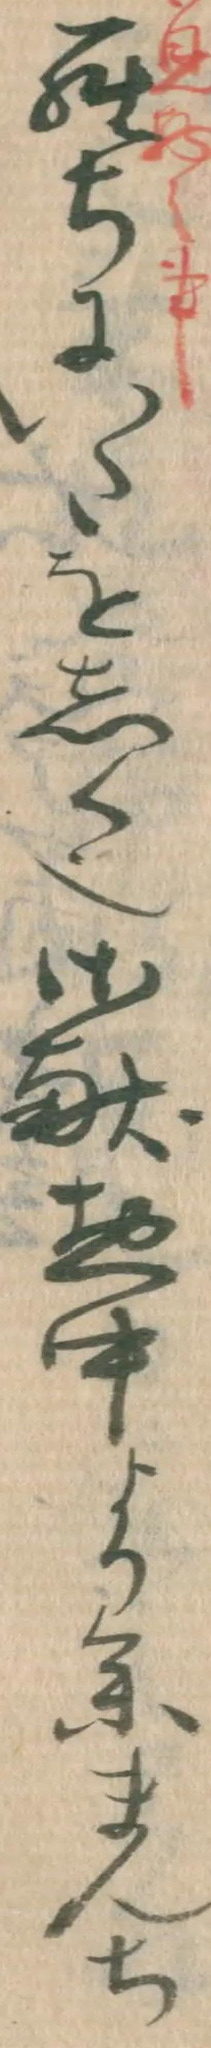らちにいたをしく也御献惣中より参まんち
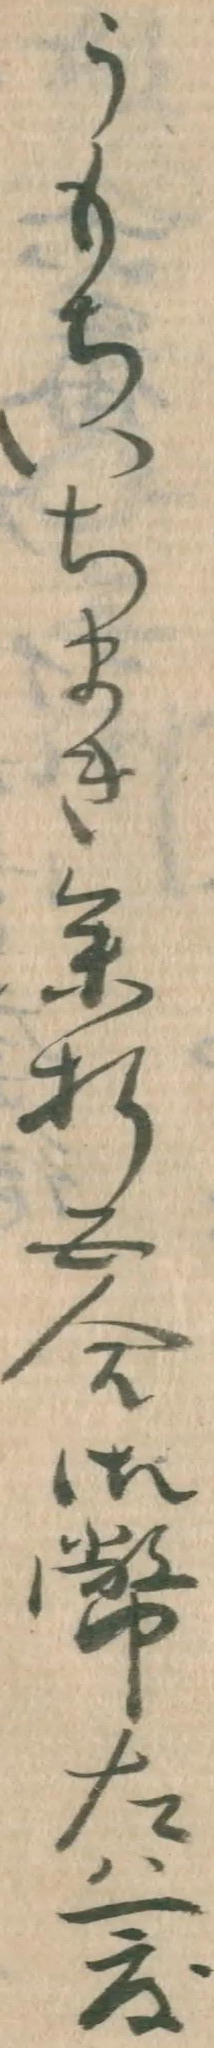うもちいちまき参折五合御幣左ハ一度
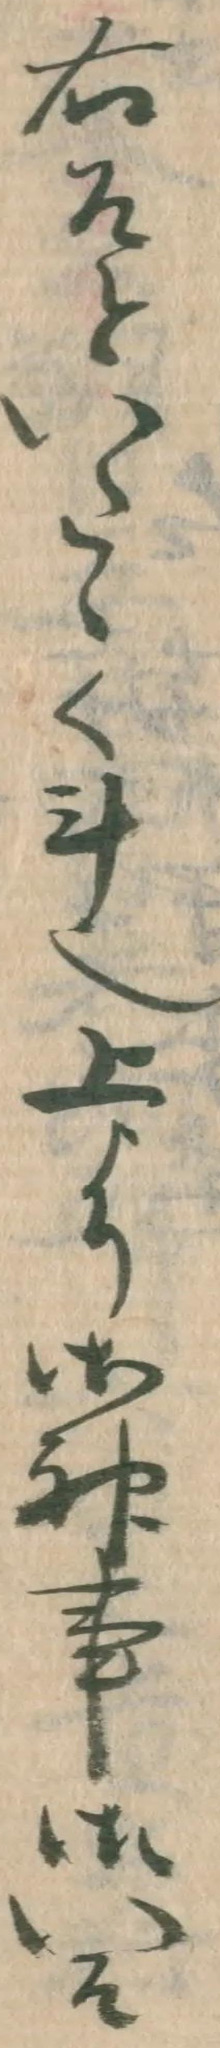右そといたゝく計也上より御神事御いそ
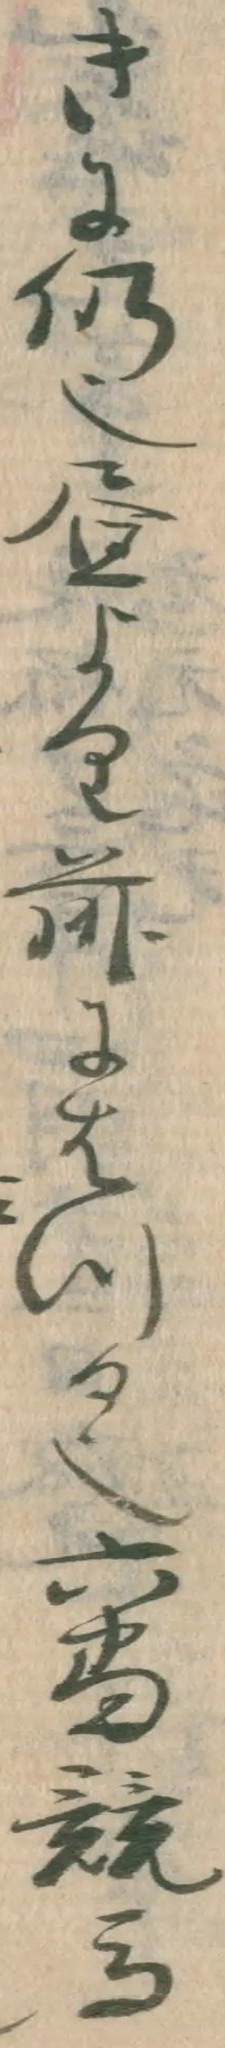きに仍也昼より前にはつる也六番競馬
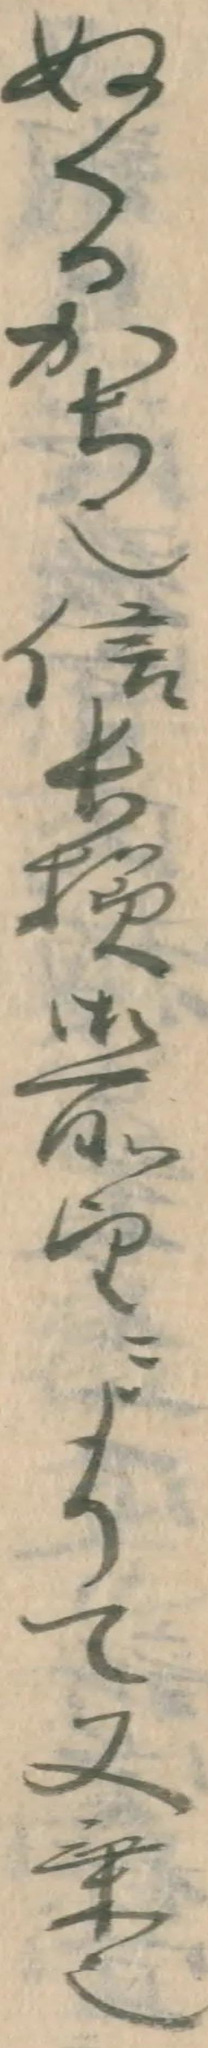ぬくるかち也信長様御所望ニよりて又乗也
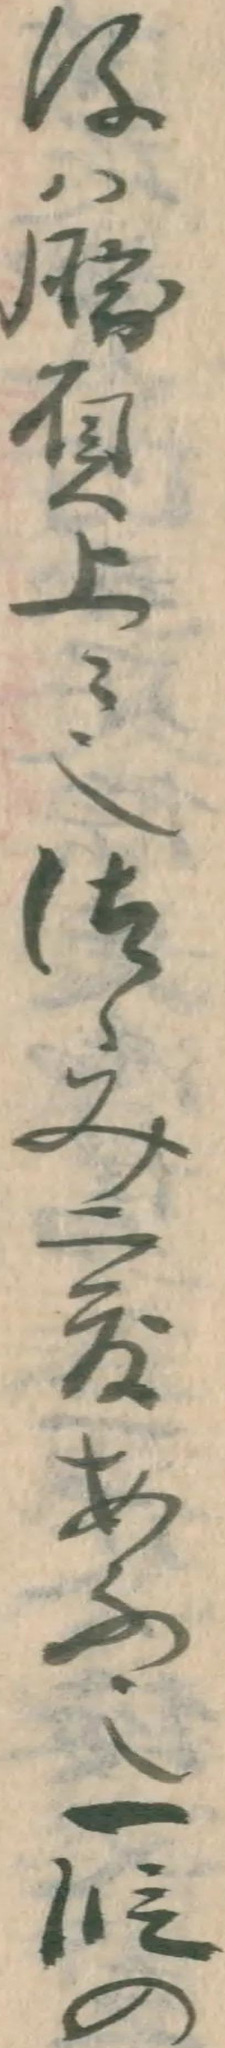後ハ勝負上々也つゝみ二度あふ也一段の
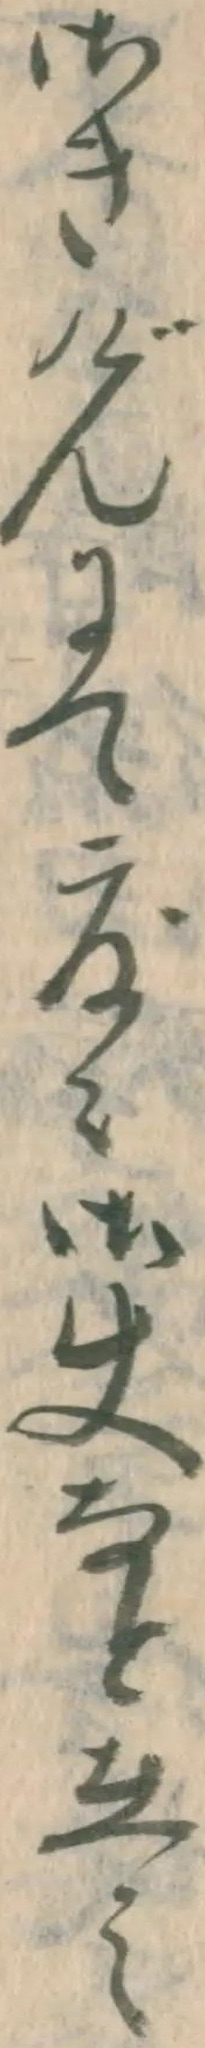御きげんにて度々御使なと在之
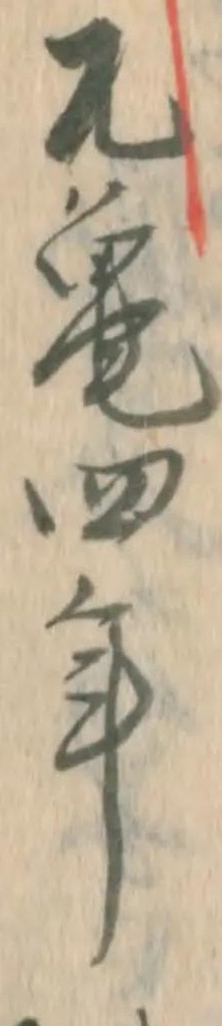元亀三年
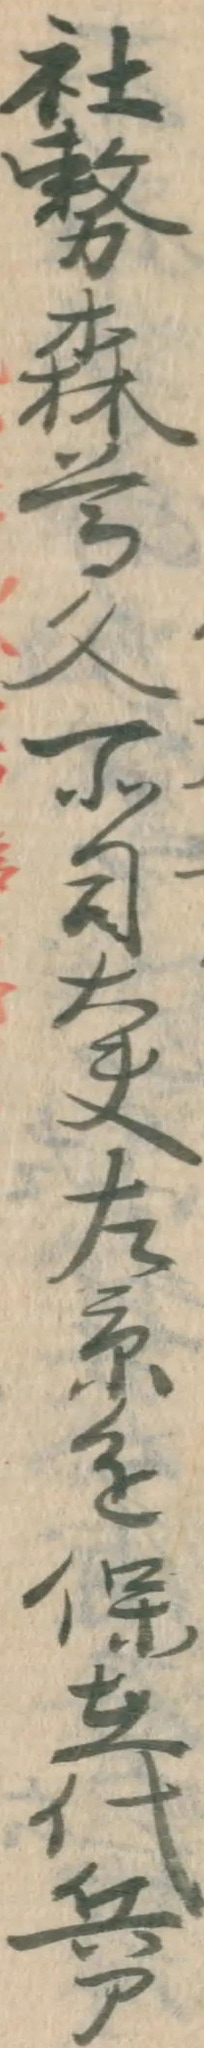社務森尊久所司大夫左京進保在代兵部
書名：賀茂社記録. 第10冊
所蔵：国立国会図書館 National Diet Library, JAPAN
